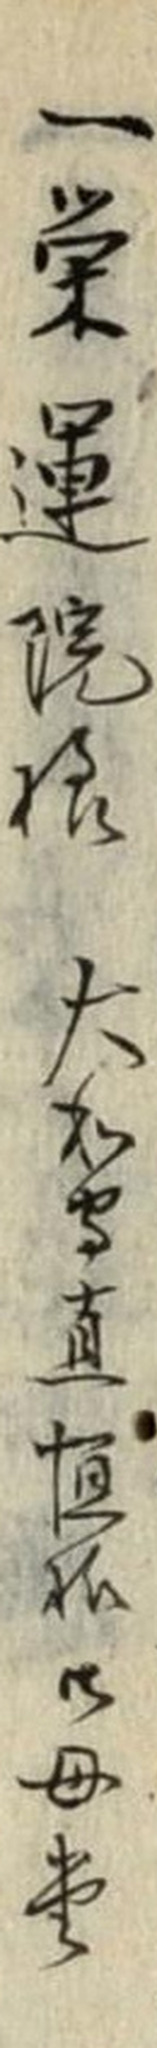一栄運院様大和守直恒様御母堂
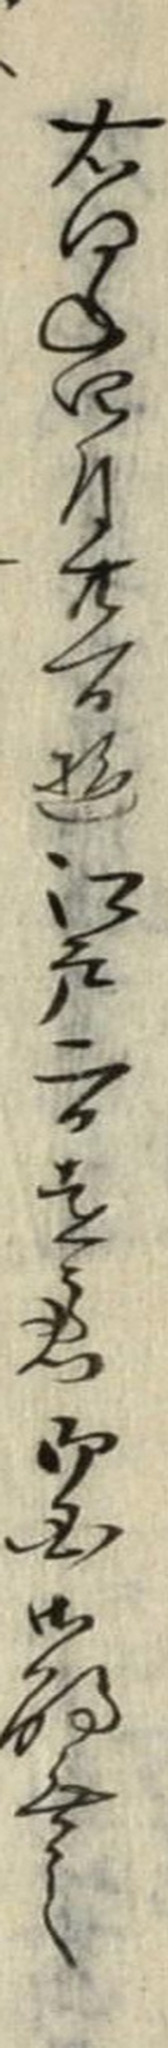右同年四月廿一日逝江戸二日遠慮御国御触無之
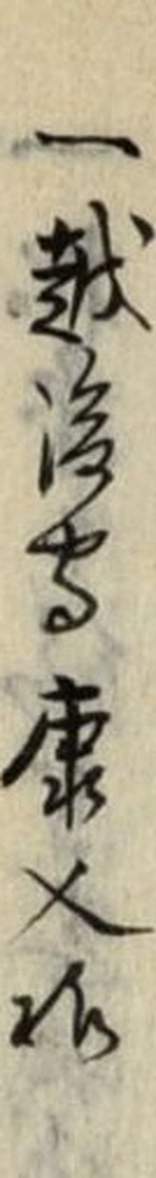一越後守康乂様
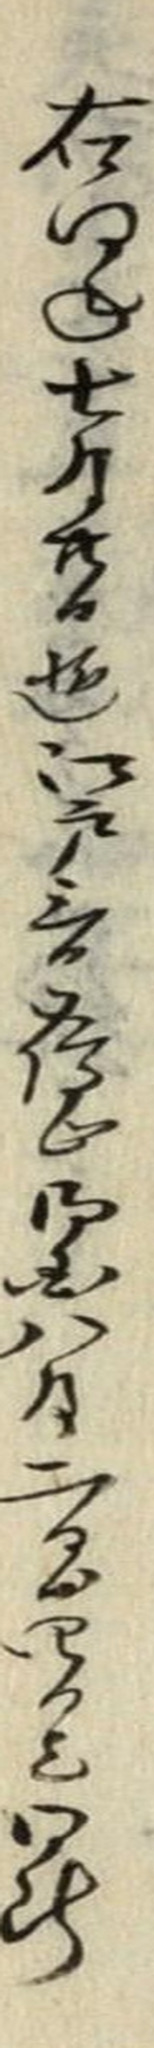右同年七月廿日逝江戸三日御停止御国八月二日ゟ四日迄同断
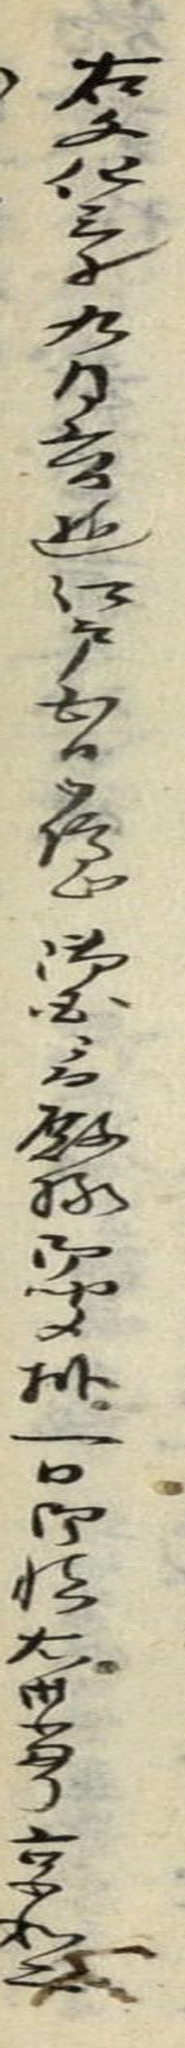右文化三刁九月六日逝江戸五日御停止御国にて殿様御聞掛一日御慎右御当り享和二
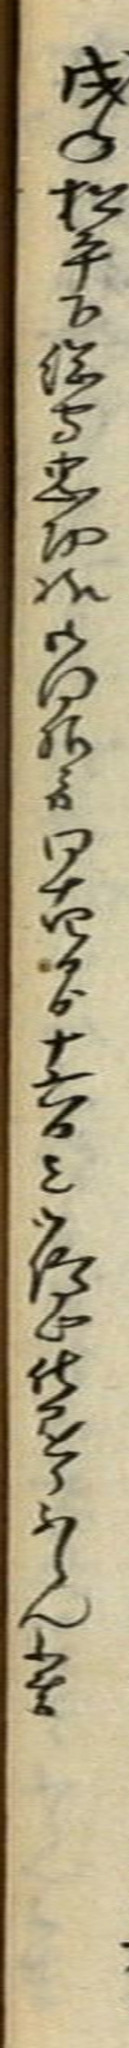戌年松平下総守忠功様御同様に付同十四日ゟ十六日迄御停止仕懸りふしん不苦
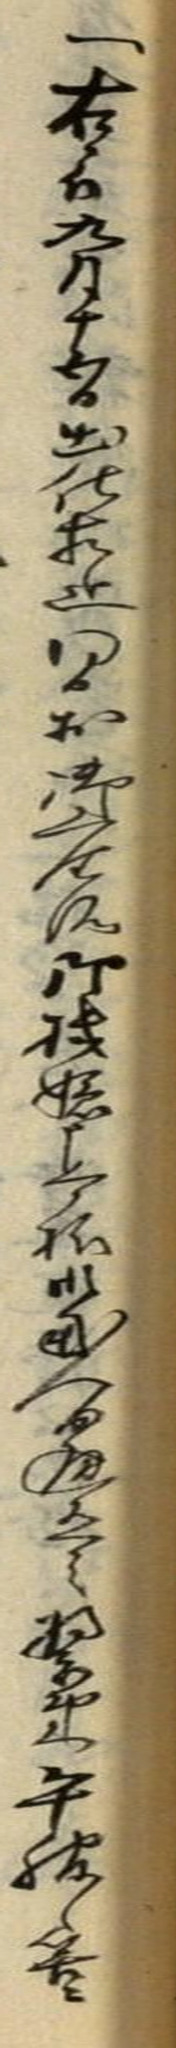一右に付九月十五日出仕相止同日於御座所御機嫌申上候様御用人ゟ通有之装束平服之筈に
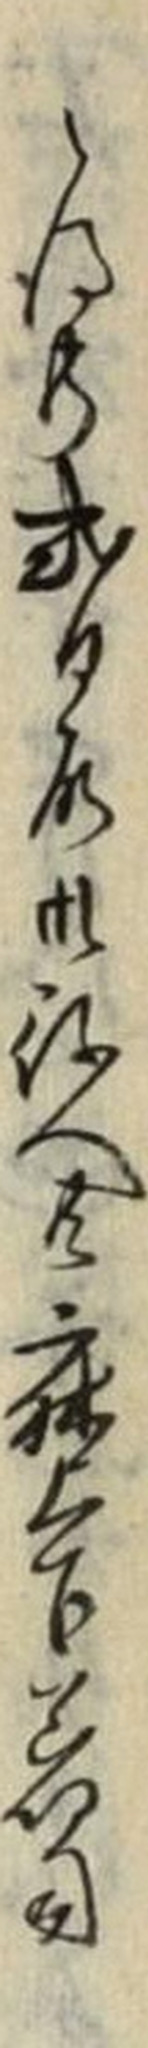候得共式日故御役人共麻上下着用
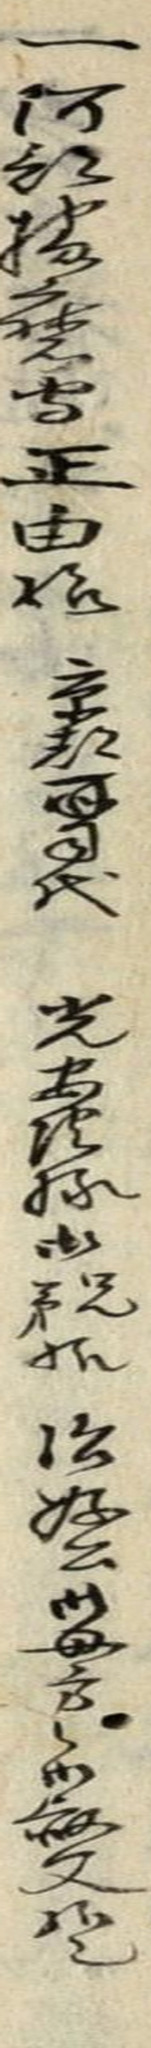一阿部播磨守正由様京都所司代光安院御兄弟様治好公御母方之御叔父様也
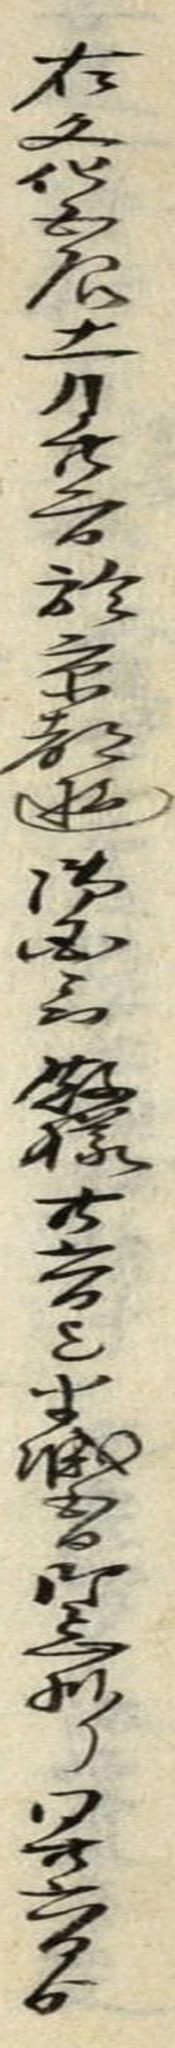右文化五辰十一月廿二日於京都逝御国にて殿様廿六日迄半減五日御忌掛り同廿六日ゟ
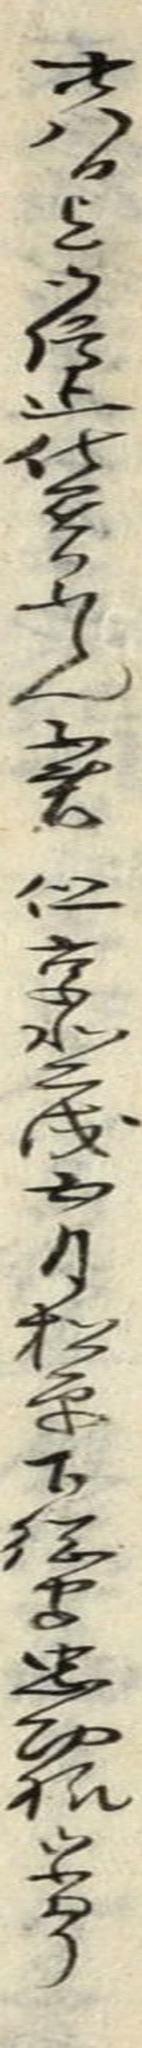廿八日迄御停止仕懸りふしん不苦但享和二戌五月松平下総守忠功様御当り
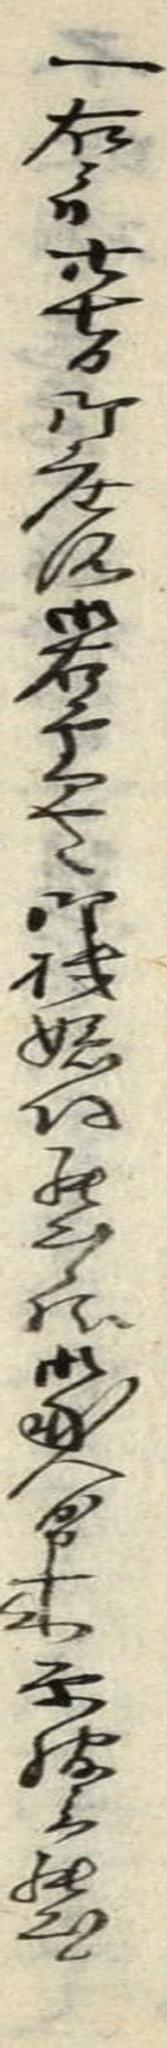一右に付廿七日御座所御右筆部やへ御機嫌伺罷出候様御用人ゟ申来平服にて罷出ル
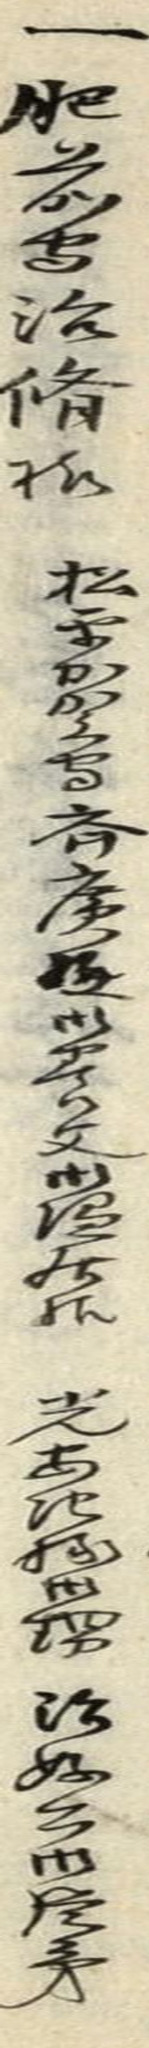一肥前守治脩様松平加賀守斉広殿御養父御隠居様光安院様御甥治好公御従弟
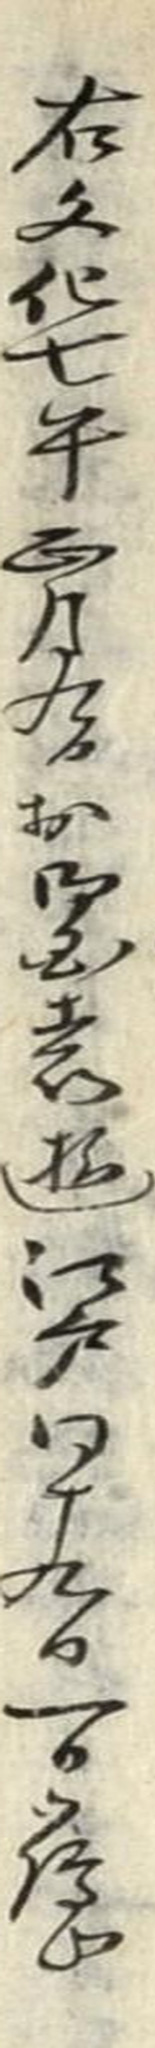右文化七午正月九日於御国表逝江戸同十九日一日御停止
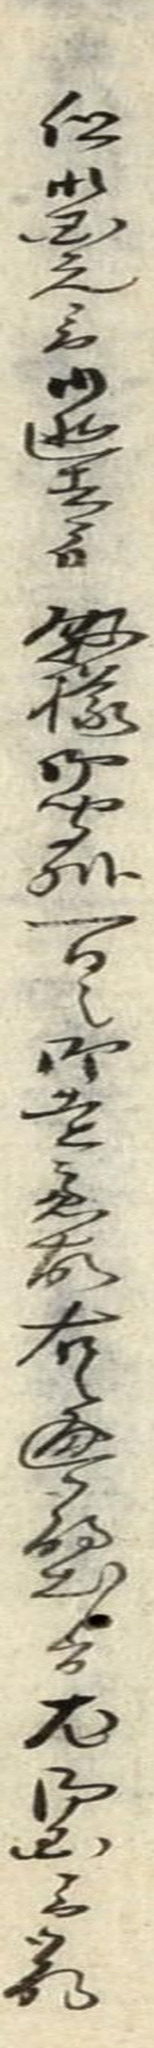但御国元にて御逝去に付殿様御聞掛一日之御遠慮故右之通御触出候旨尤御国にて御触
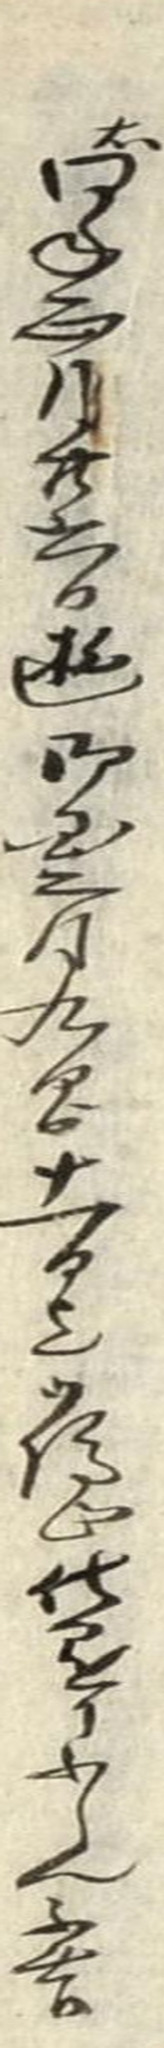右同年正月廿六日逝御国二月九日ゟ十一日迄御停止仕懸りふしん不苦
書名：御停止異変死失
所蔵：福井県文書館 Fukui Prefectural Archives
